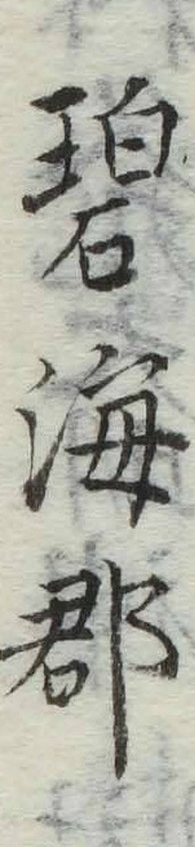碧海郡

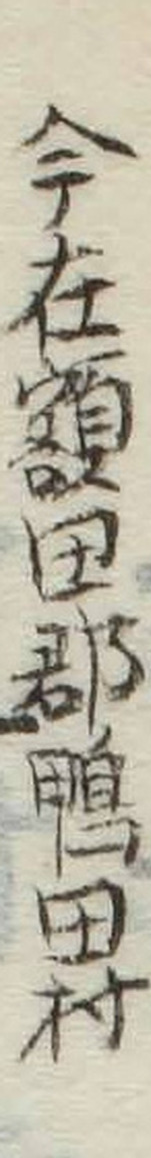今在額田郡鴨田村

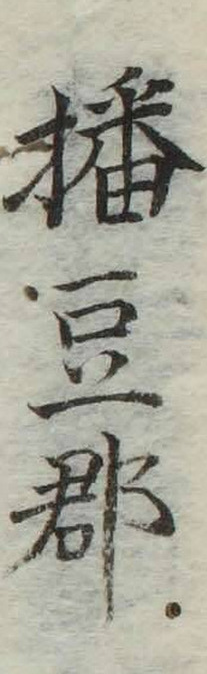播豆郡

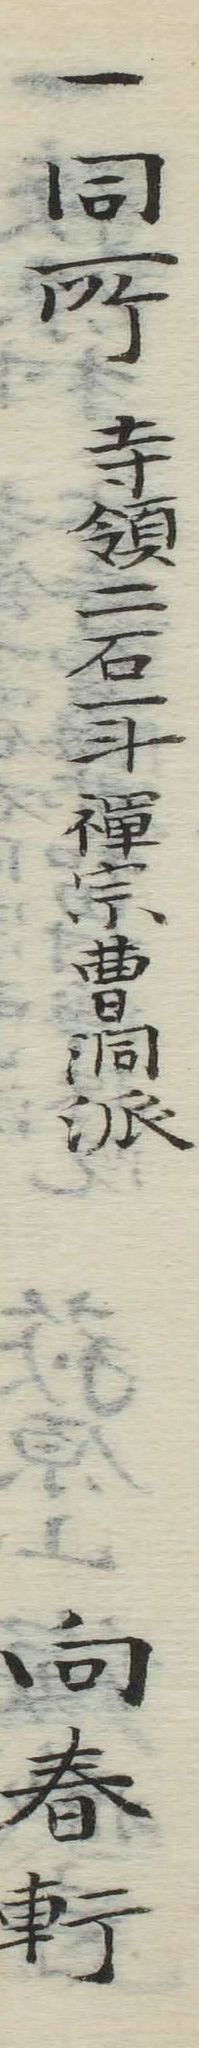一同所寺領二石一斗禅宗曹洞派向春軒
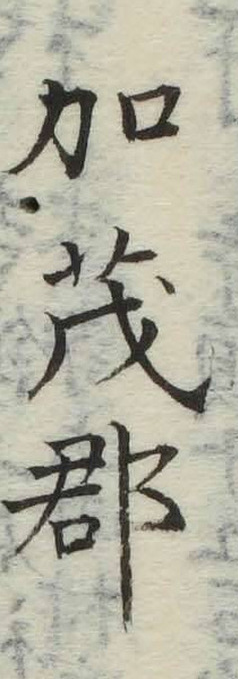加茂郡

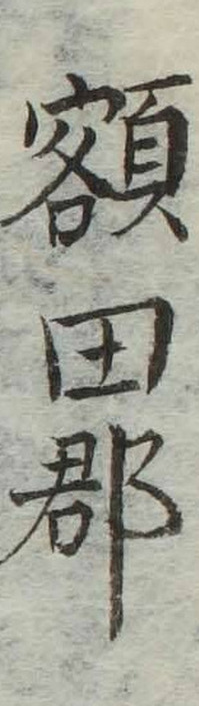額田郡

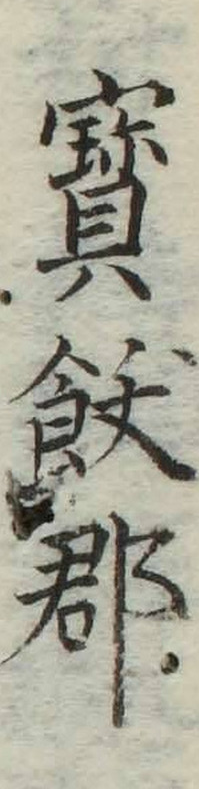宝飫郡

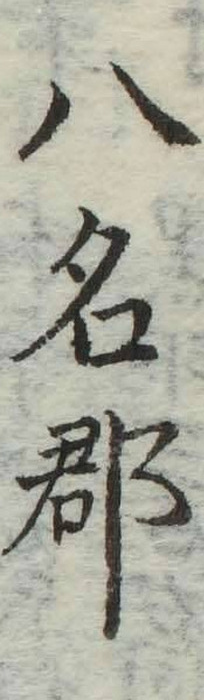八名郡

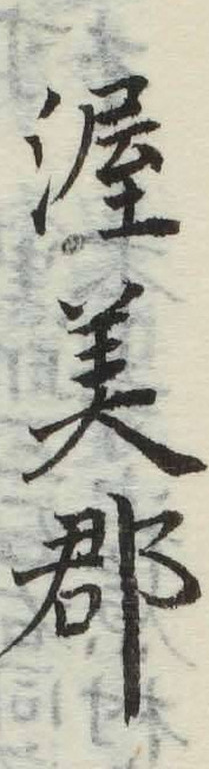渥美郡

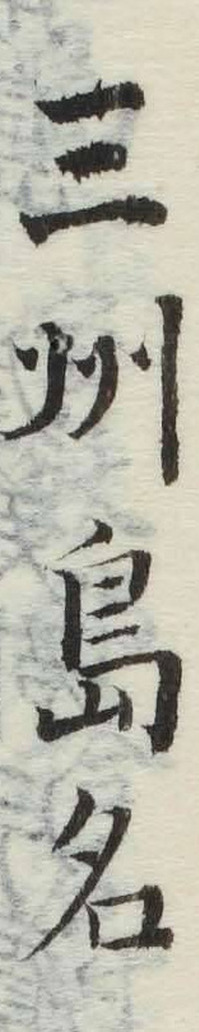三州島名
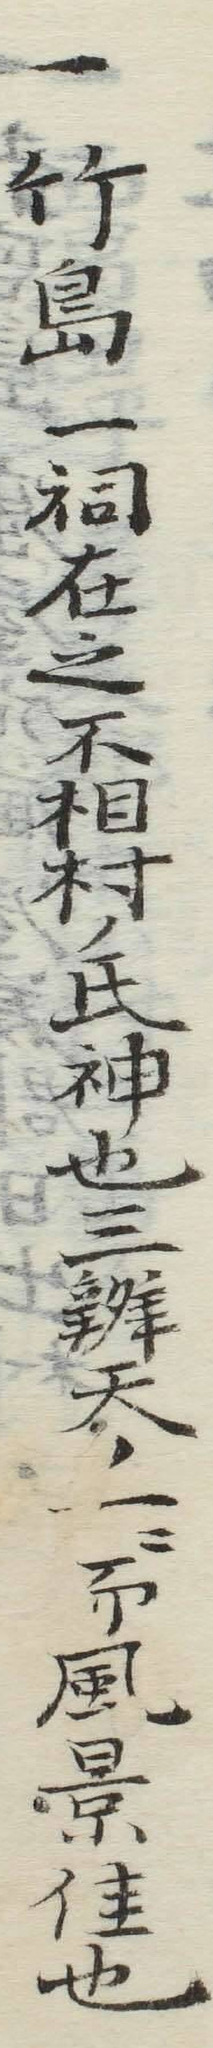一竹島一祠在之不相村ノ氏神也三弁天ノ一而風景佳也
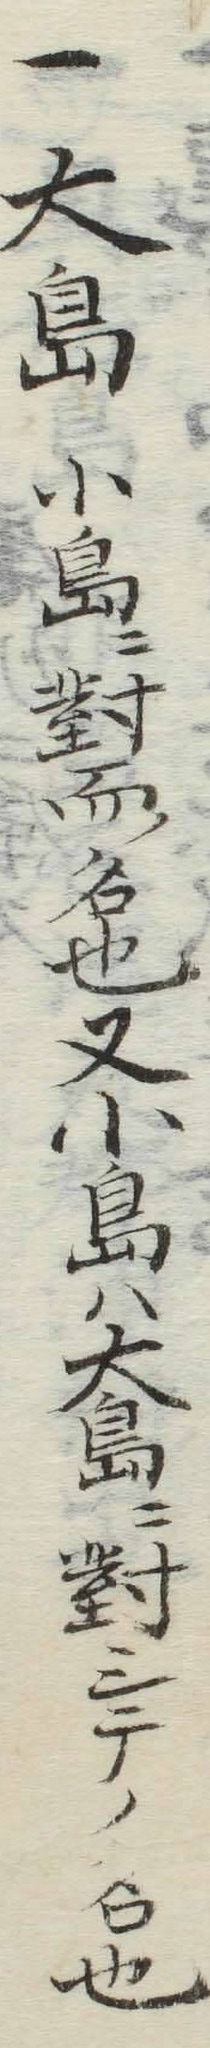一大島小島対而名也又小島ハ大島対シテノ名也
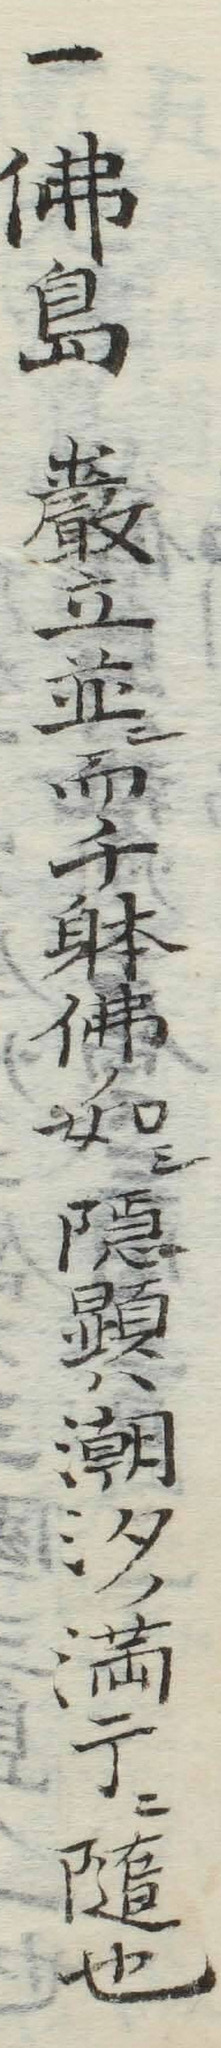一仏島巌立並而千体仏ノ如隠顕ハ潮汐満干随也
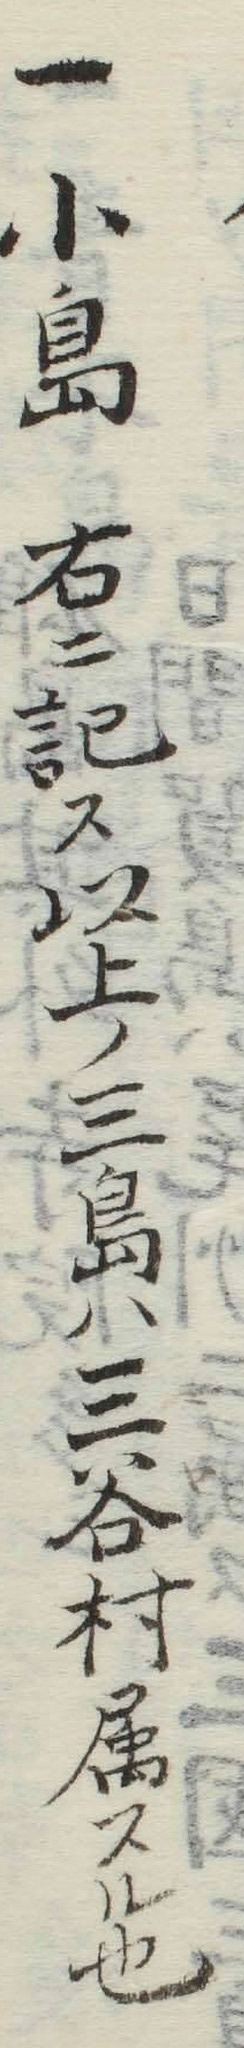一小島右ニ記ス以上ノ三島ハ三谷村属スル也
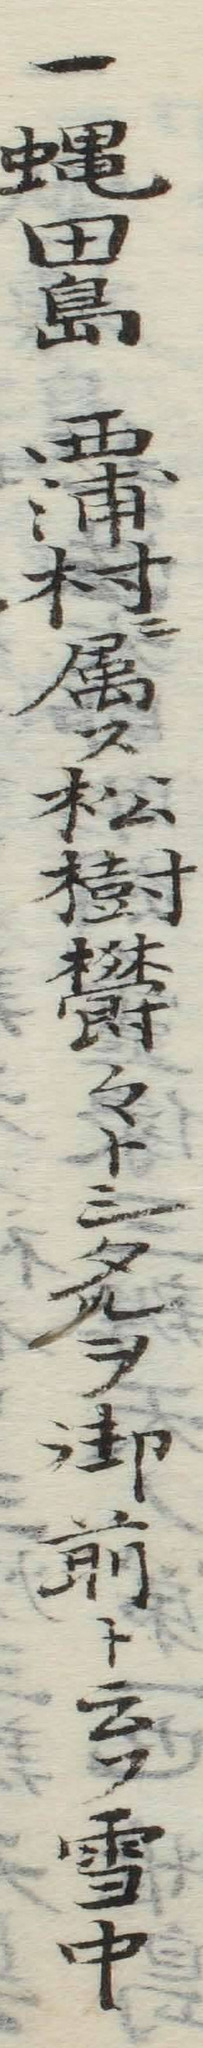一蝿田島西浦村属ス松樹木鬱々トシタルヲ御前ト云フ雪中
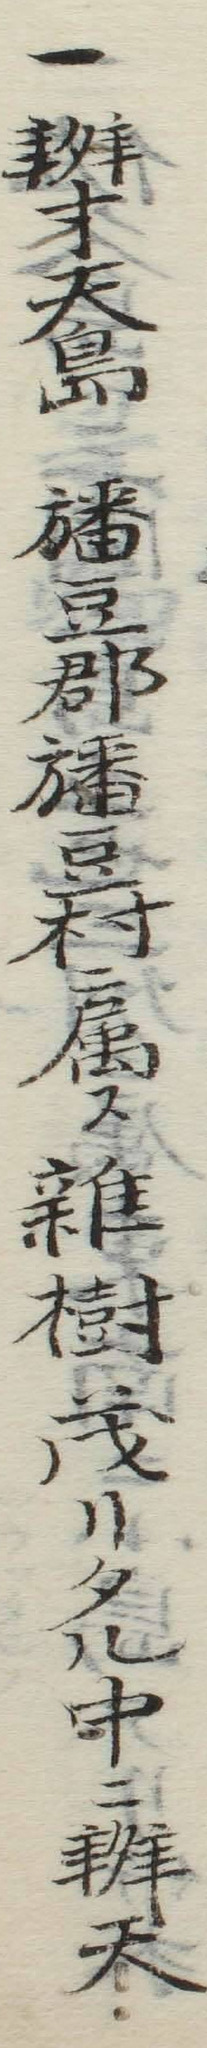一弁才天島旙豆郡旙豆村ニ属ス雑樹茂リタル中ニ弁天
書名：三河国二葉松
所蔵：国文学研究資料館
